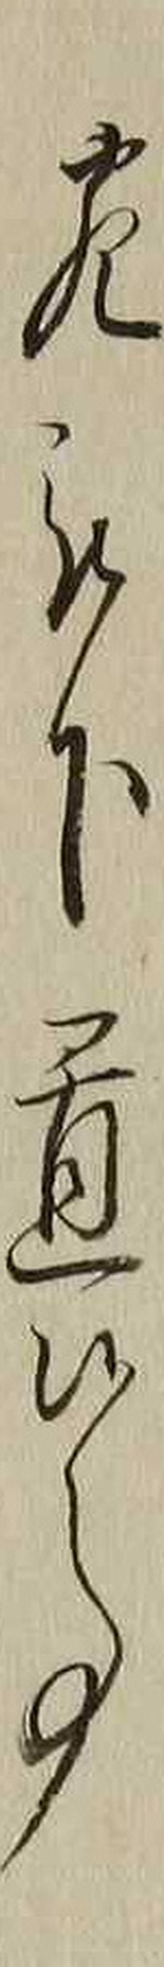宛被下置候事
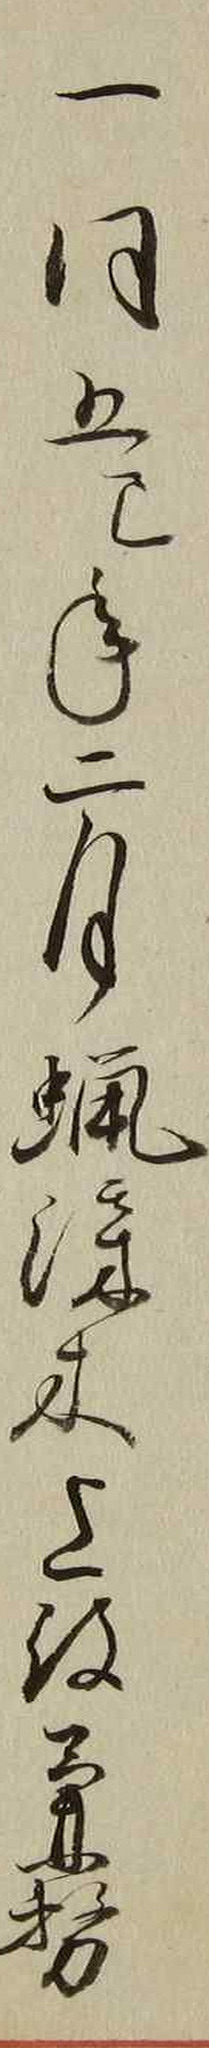一同五巳年二月蝋漆木上役兼務
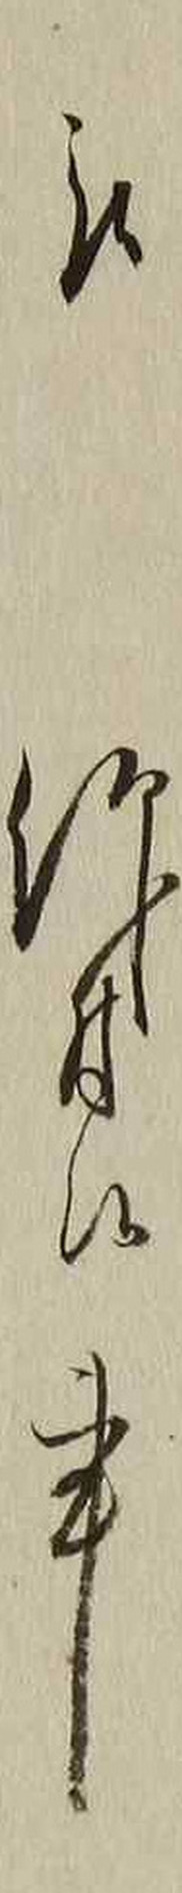被仰付候事
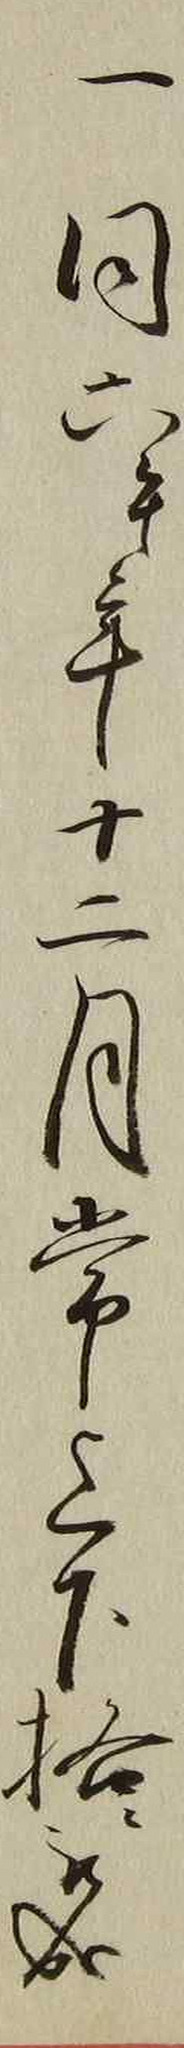一同六午年十二月常上下格ニ被成
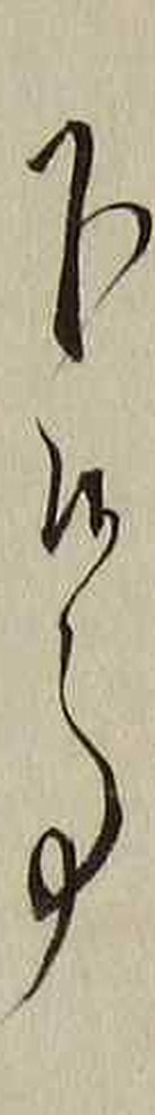下候事
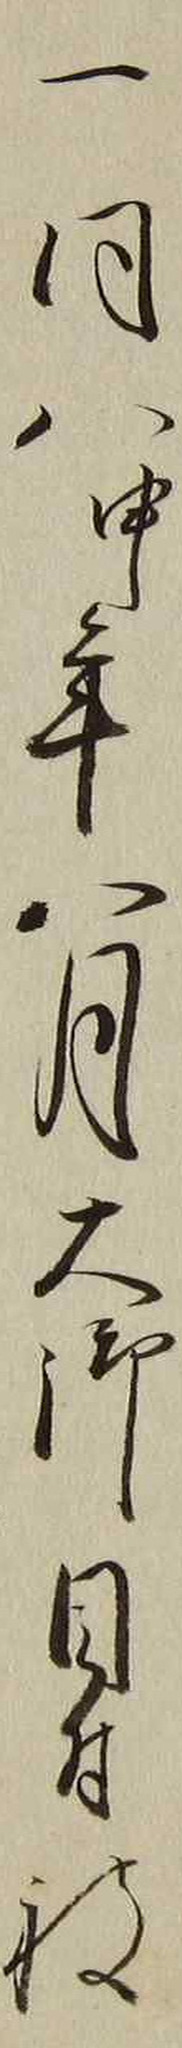一同八申年八月大御目付被
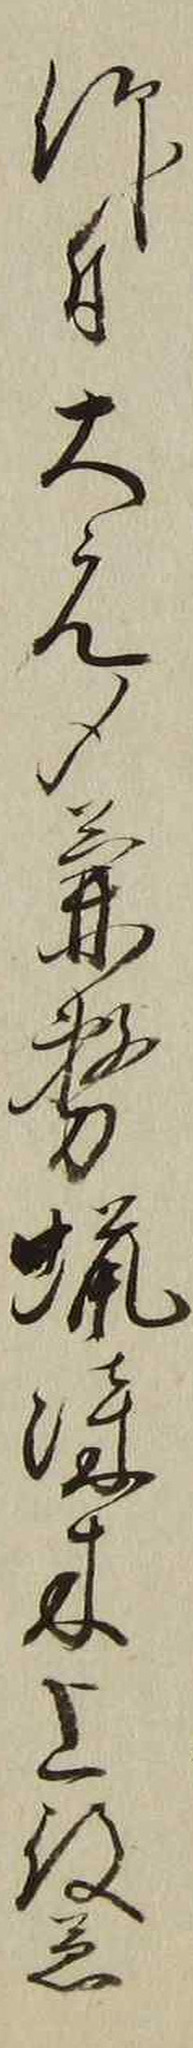仰付大元〆兼務蝋漆木上役兼
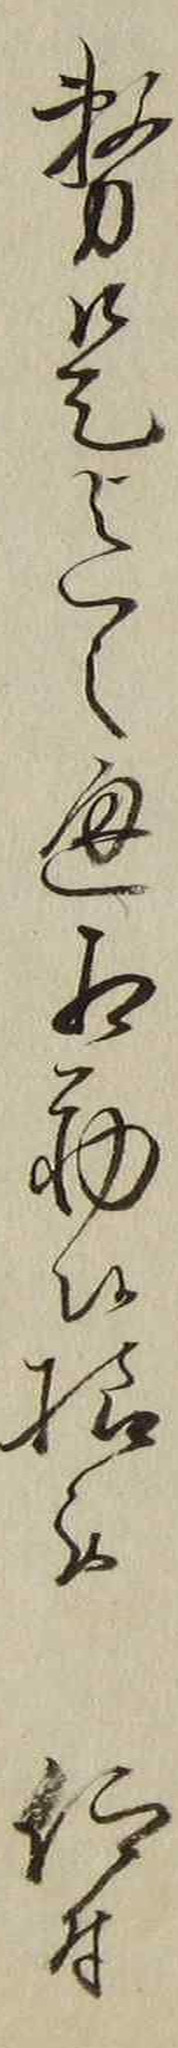務是迄之通相勤候様被仰付
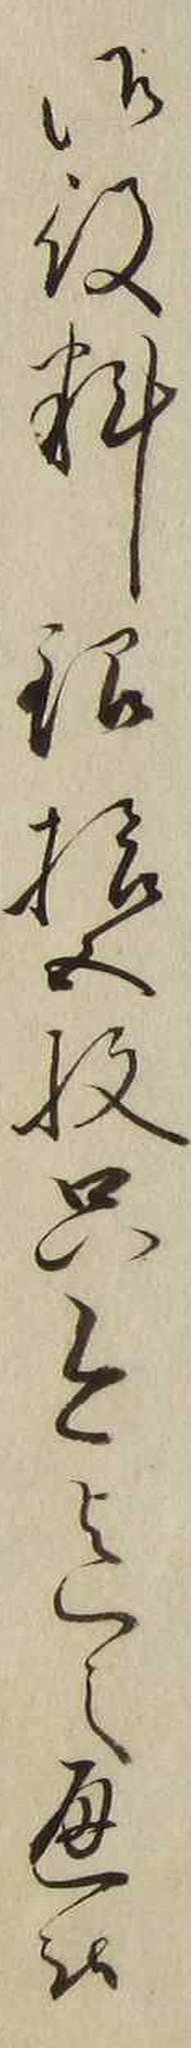御役料銀拾五枚只今迄之通被

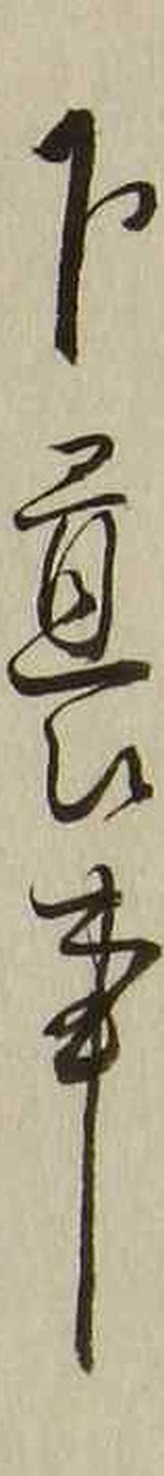下置候事
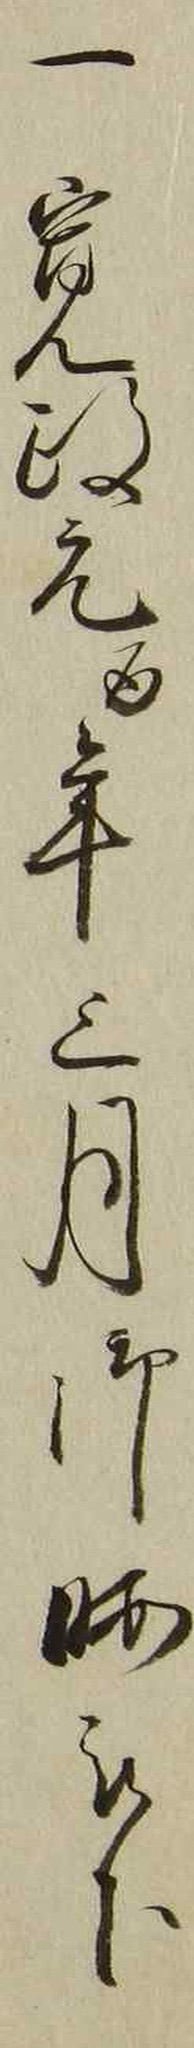一寛政元酉年三月御暇被下
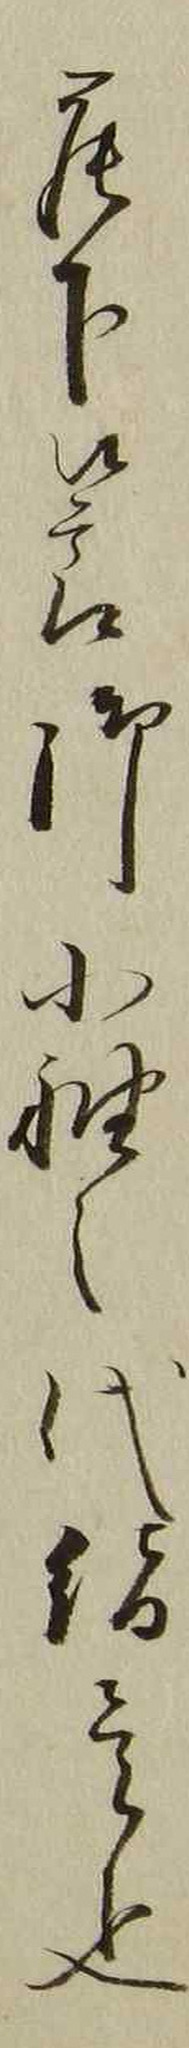罷下候節御小袖之代絹壱疋
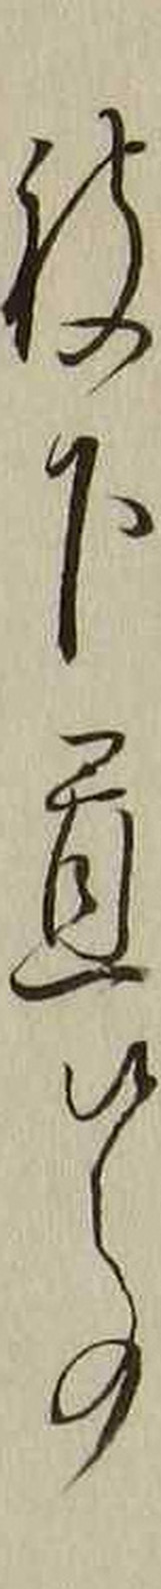被下置候事
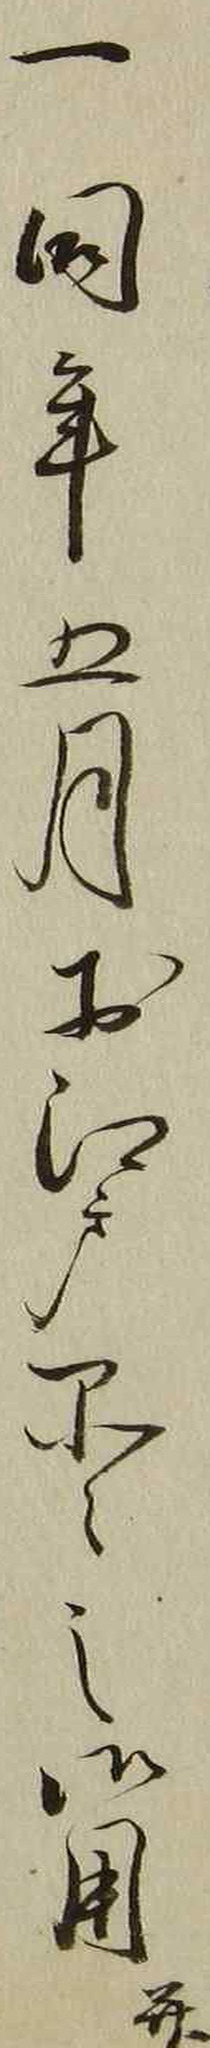一同年五月於江戸品々之御用并
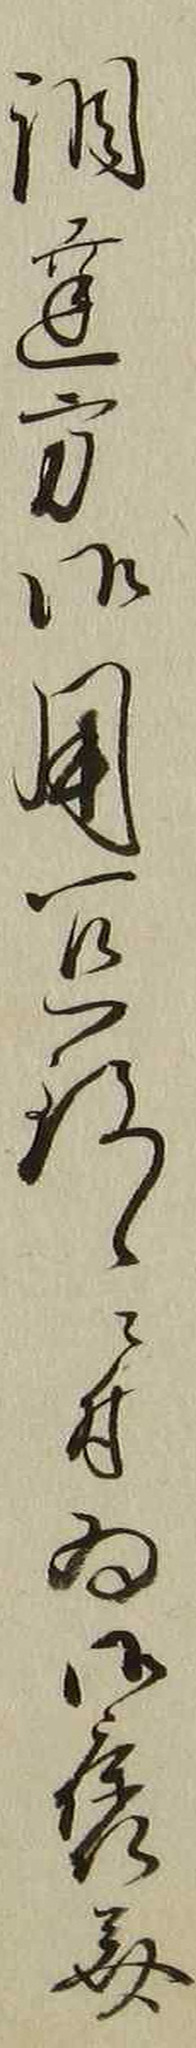調達方御用宜致候ニ付為御褒美
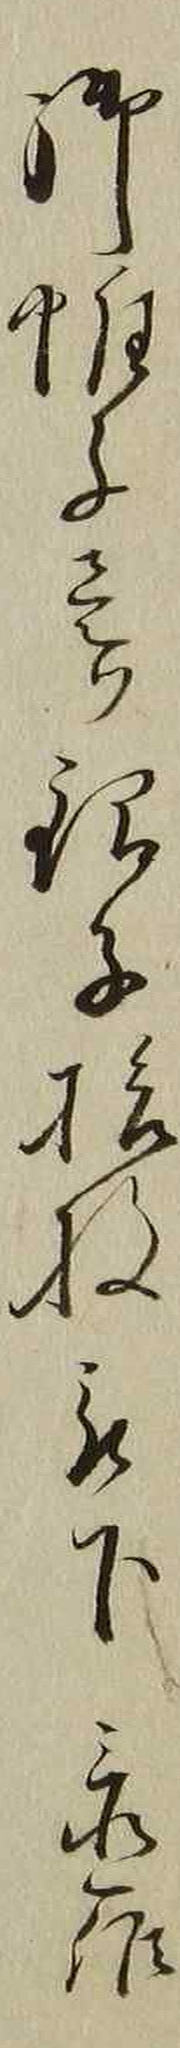御帷子壱ツ銀子拾枚被下忝候
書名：諸士系譜　巻之2　い之部2
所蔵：会津若松市立会津図書館
